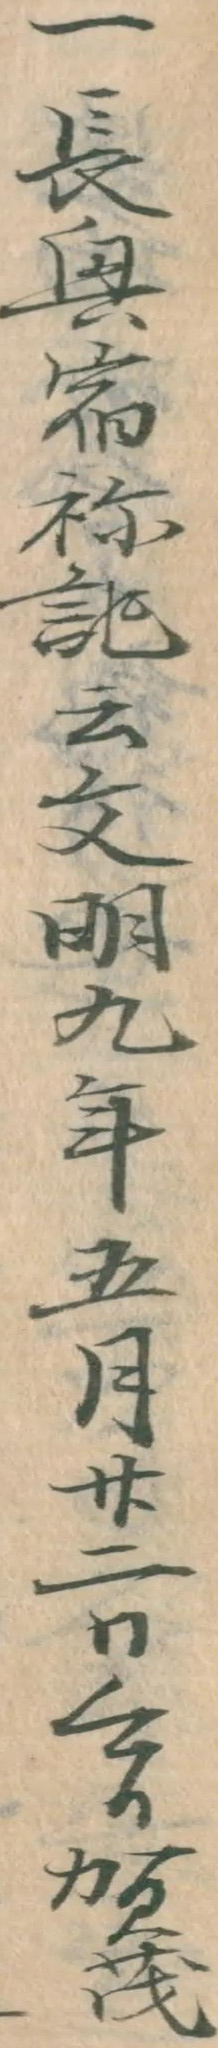一長興宿祢記云文明九年五月廿二日今日賀茂
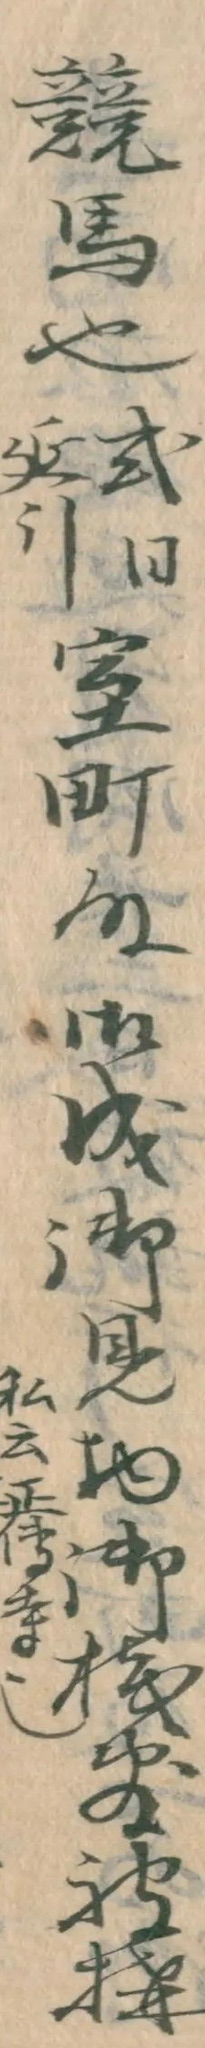競馬也式日延引室町殿御成御見物御桟敷被構
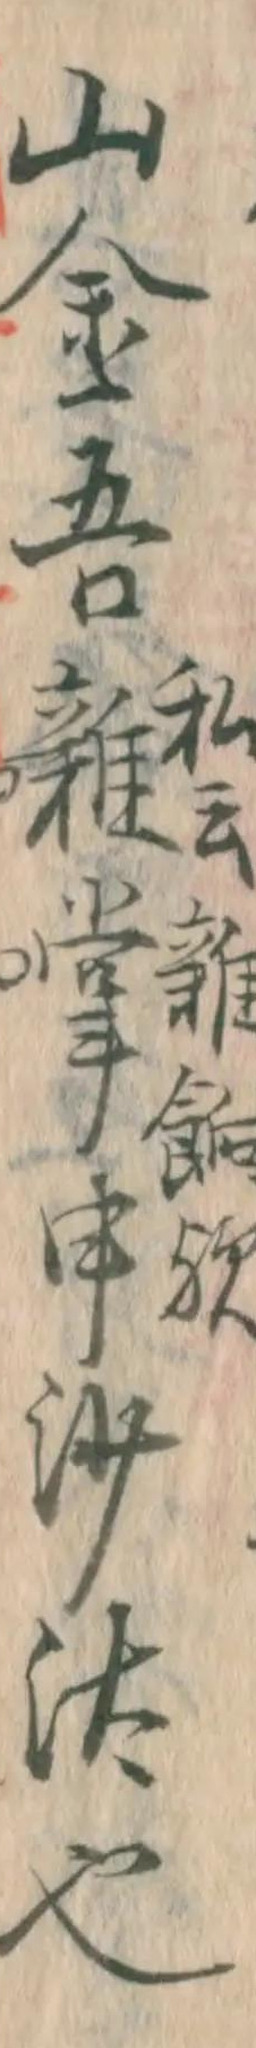山金吾雑掌申沙汰也
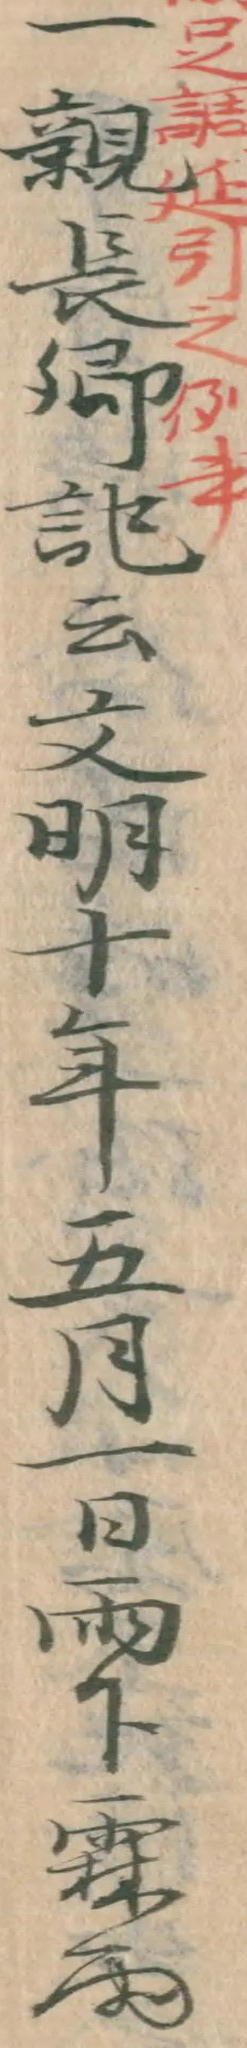一親長卿記云文明十年五月一日雨下霖雨
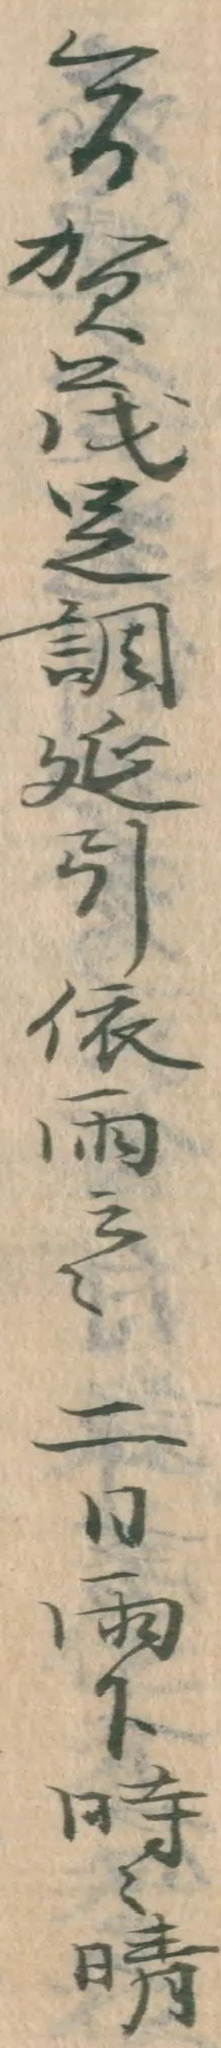今日賀茂足調延引依雨云々二日雨下時々晴
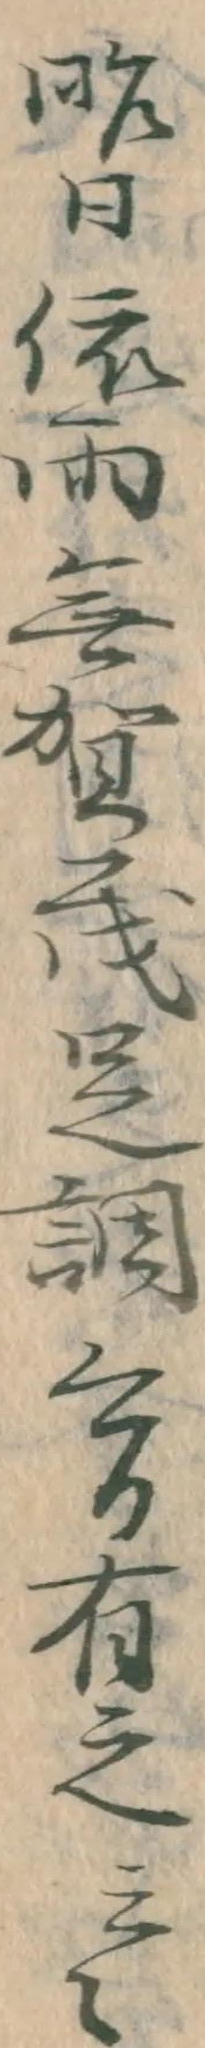昨日依雨無賀茂足調今日有之云々
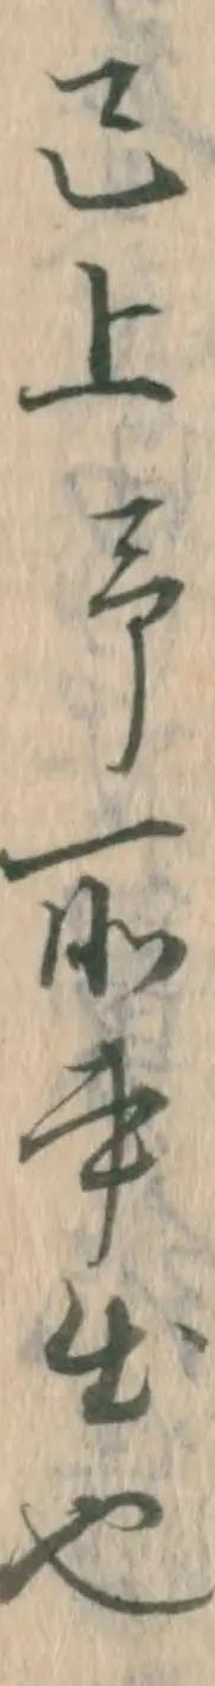已上予所書出也
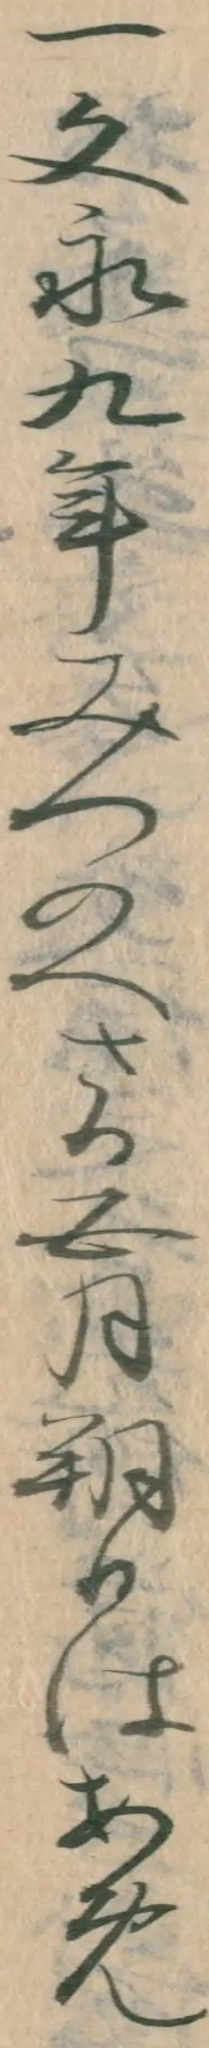一文永九年みつのへさる五月朔日はあめ
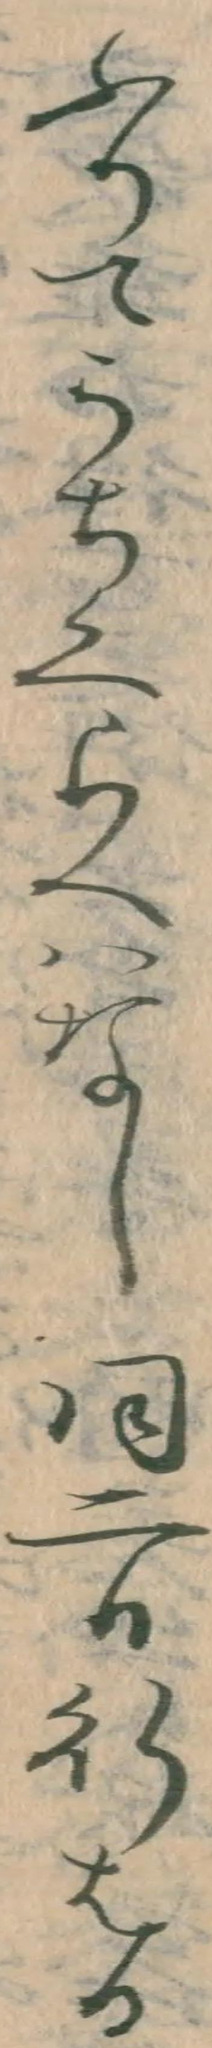ふりてうちくらへハなし同二日行はる
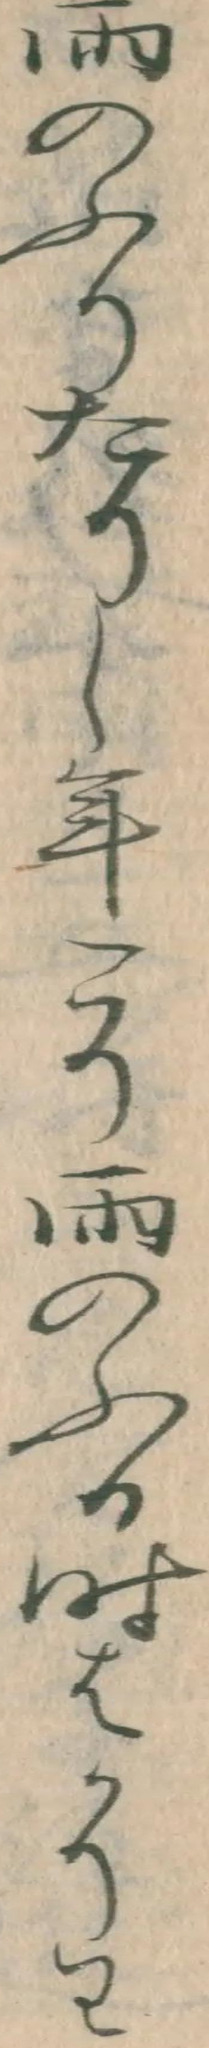雨のふりたりし年こそ雨のふる時はかりわ
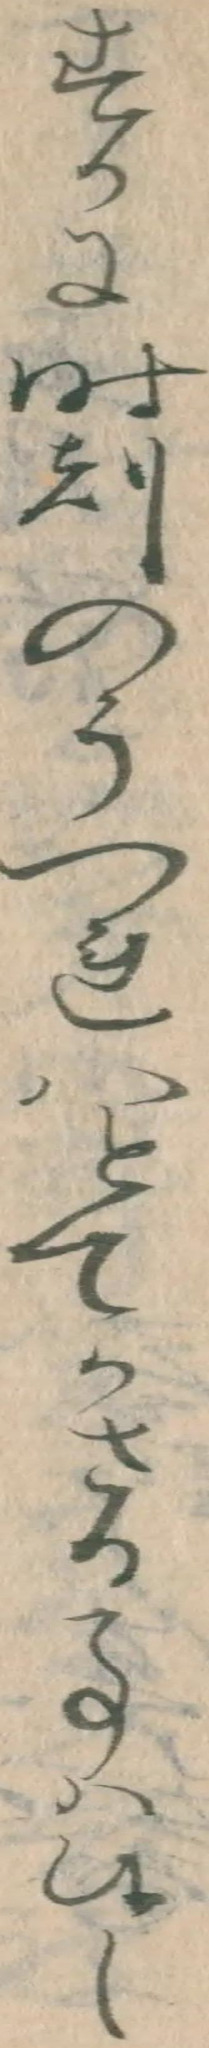すかに時刻のうつれハとてかさる事ハ候し
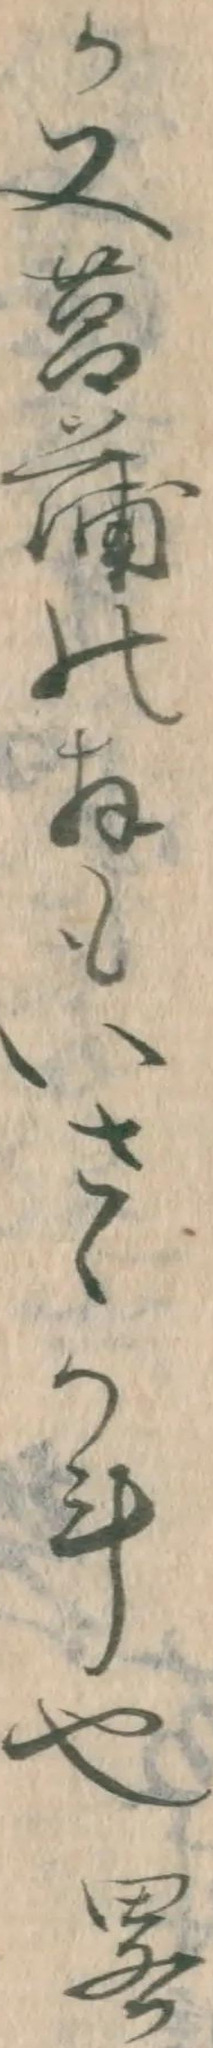か又菖蒲の拝もいさゝか計也略
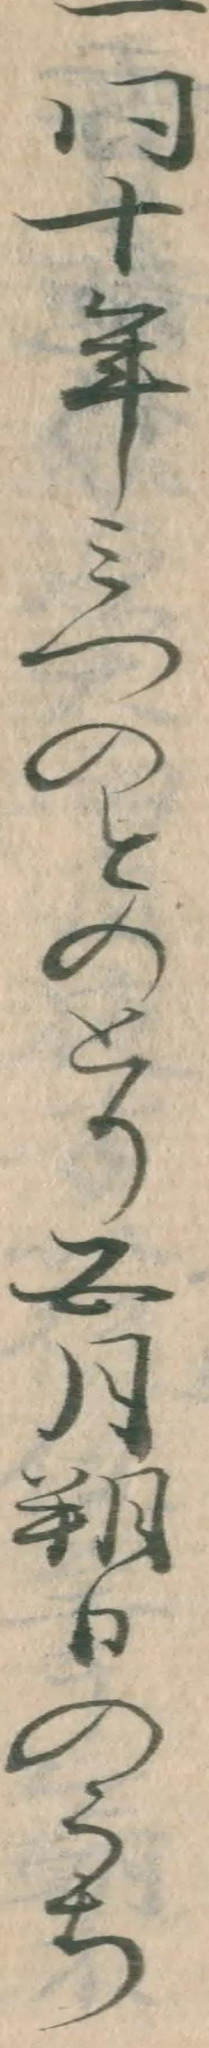一同十年みつのとのとり五月朔日のうち
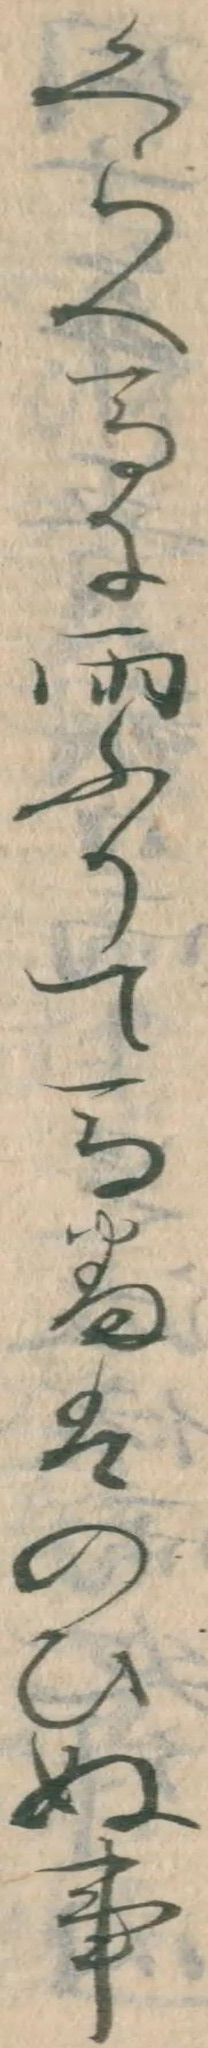くらへ馬に雨ふりて馬番はのひぬ事
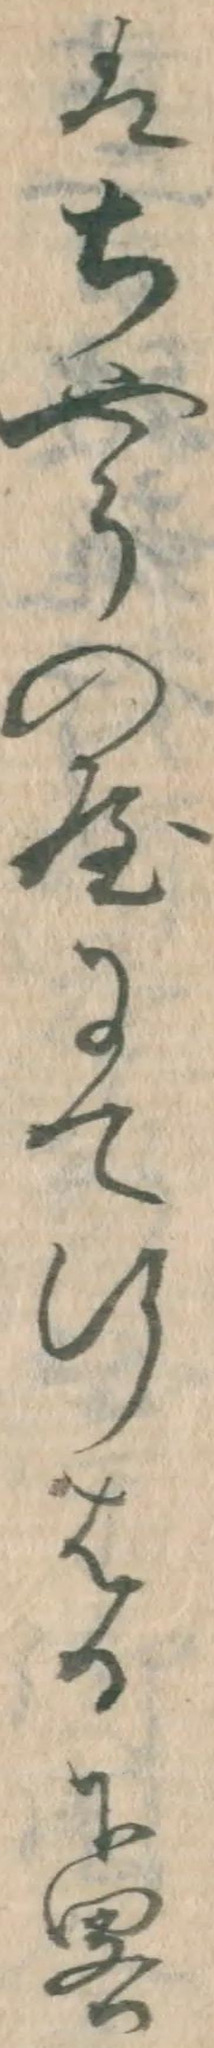はちやうの屋にて行はる下略
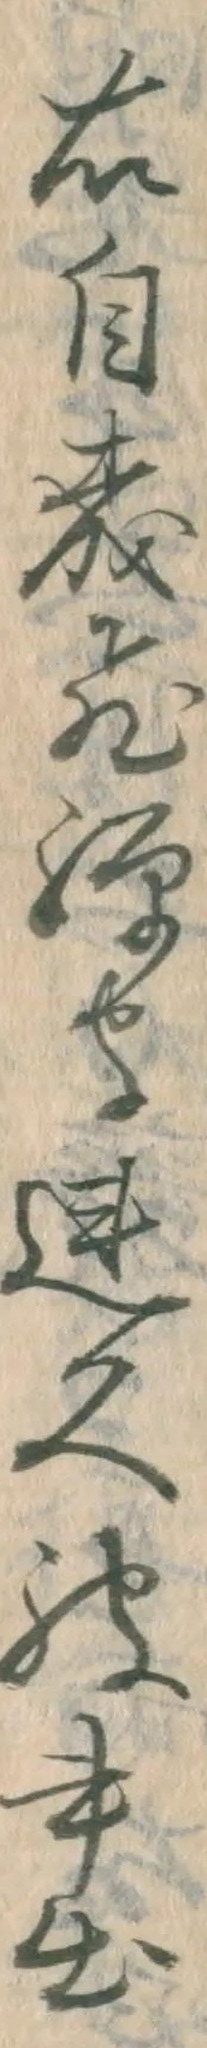右自森飛騨守連久被書出
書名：賀茂社記録. 第10冊
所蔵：国立国会図書館 National Diet Library, JAPAN
